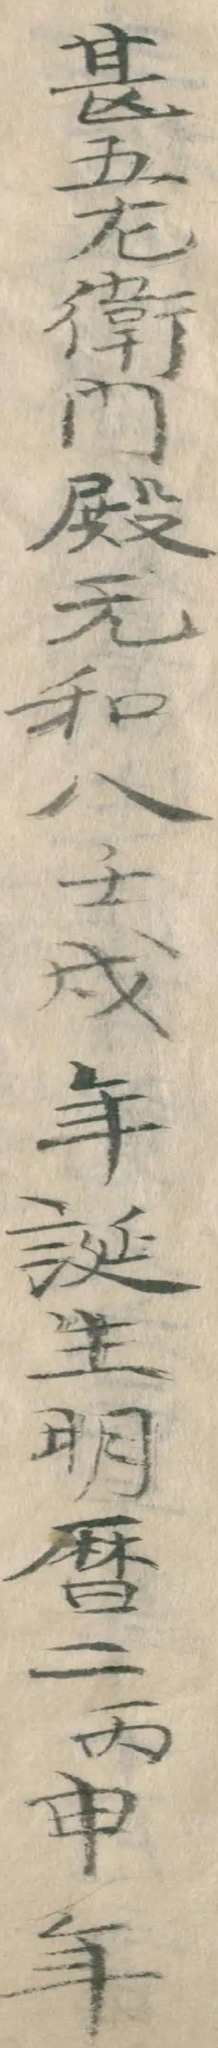甚五左衛門殿元和八年壬戌年誕生明暦二丙申年

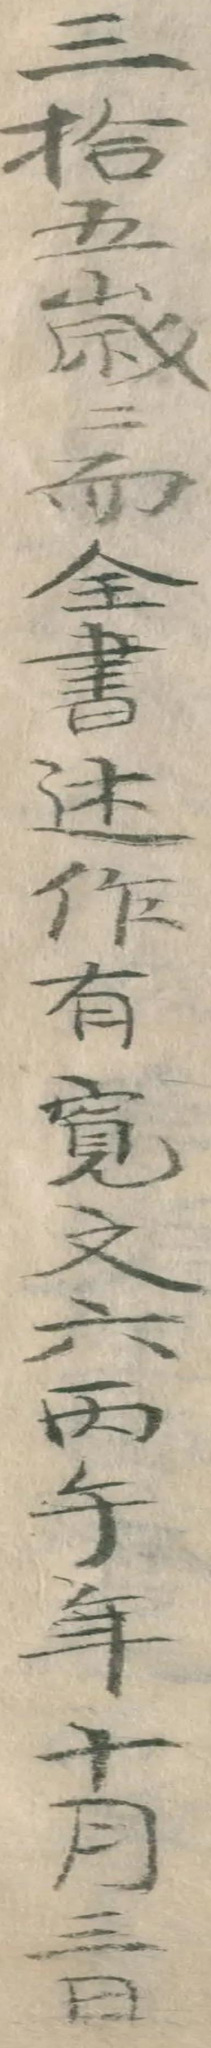三拾五歳ニテ全書述作有寛文六丙午年十月三日
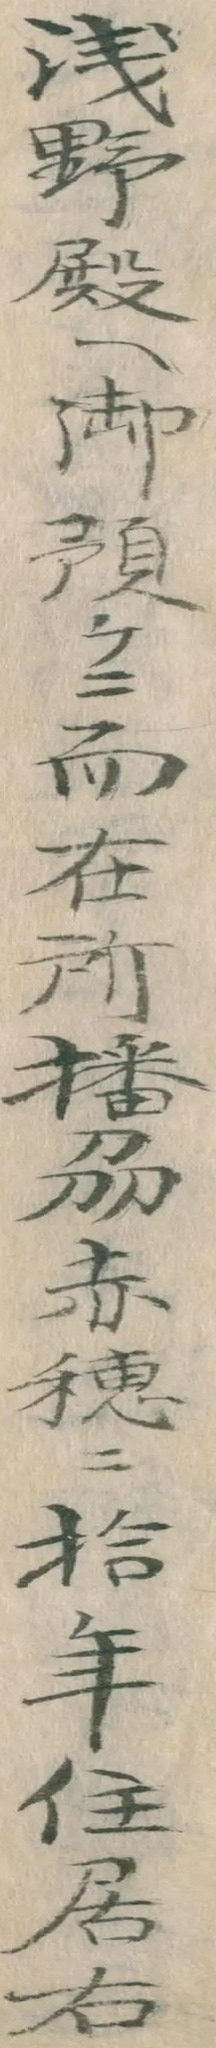浅野殿ヘ御預ケニテ在所播州赤穂ニ拾年住居右
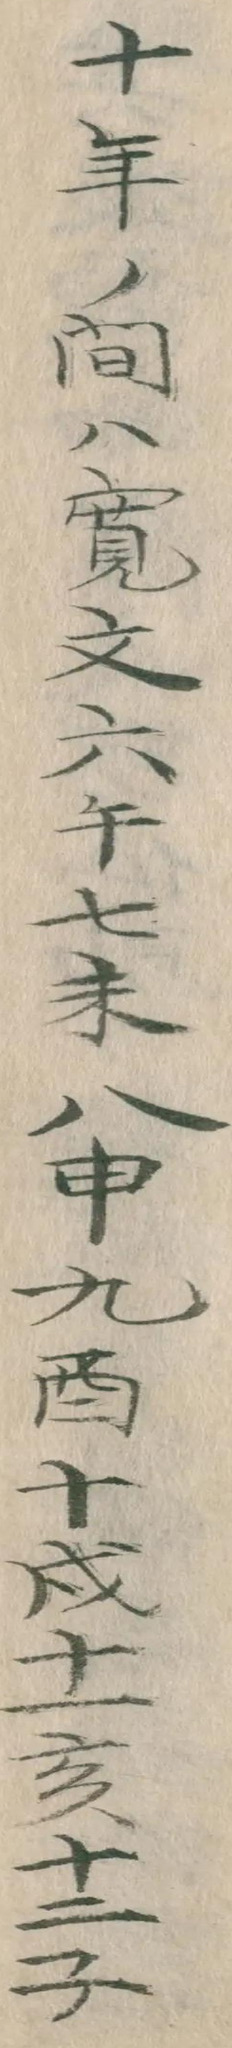十年ノ間ハ寛文六午七未八申九酉十戌十一亥十二子
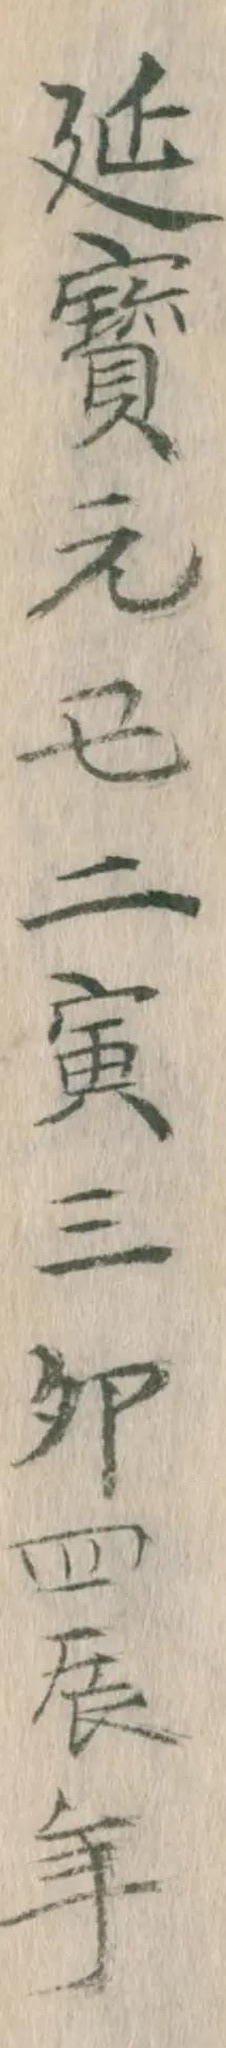延宝元丑二寅三卯四辰年
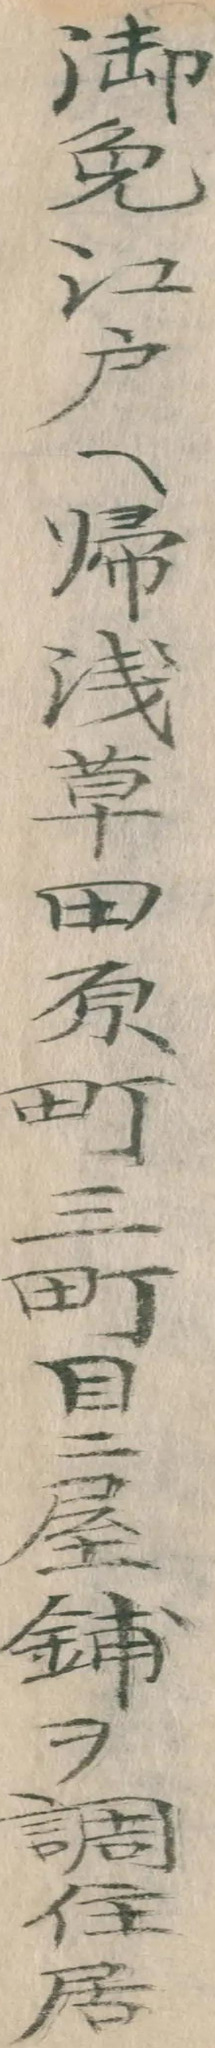御免江戸へ帰浅草田原町三町目ニ屋鋪ヲ調住居
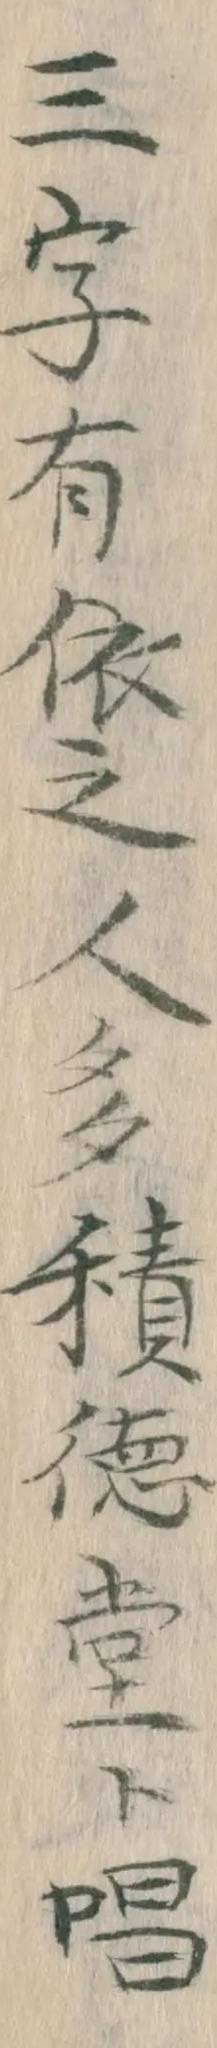三字有依之人多積徳堂ト唱
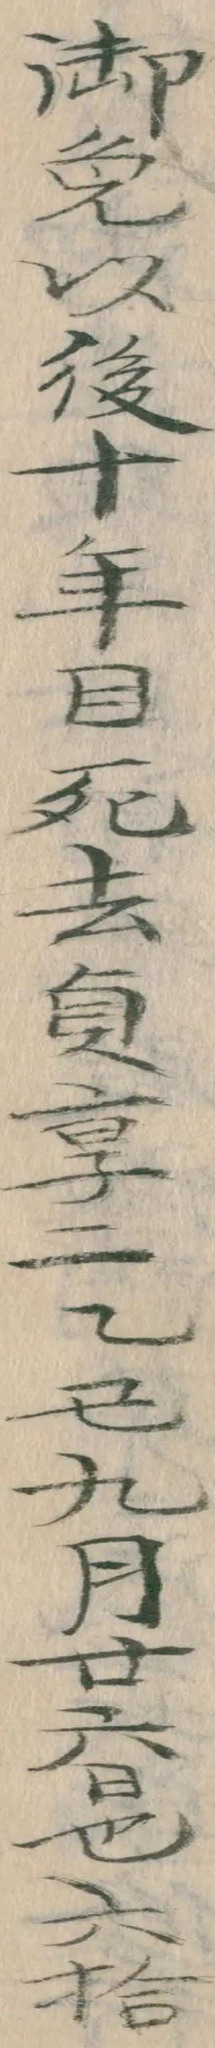御免以後十年目死去貞享二乙丑九月廿六日也六拾
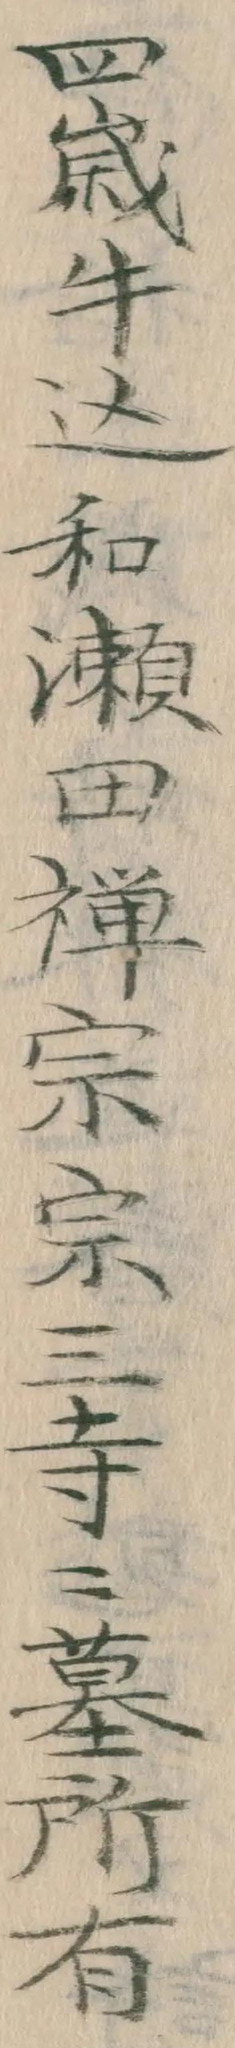四歳牛込和瀬田禅宗宗三寺ニ墓所有
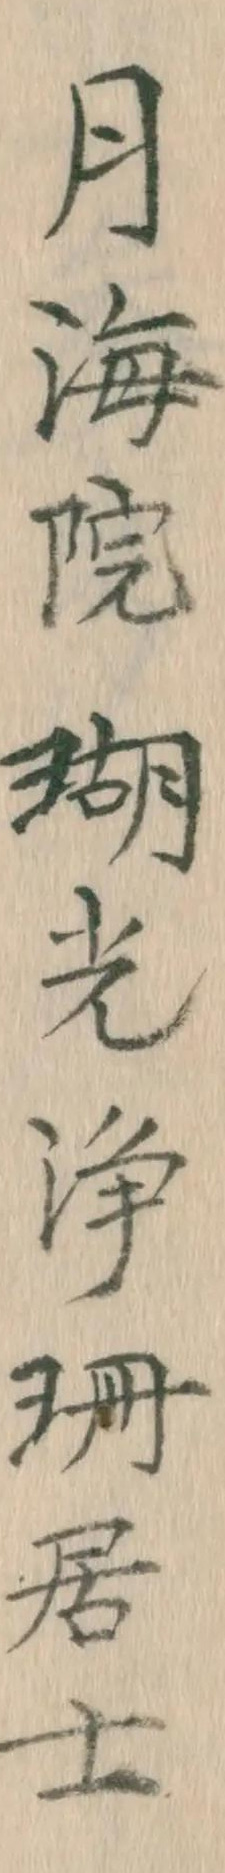月海院瑚光浄珊居士
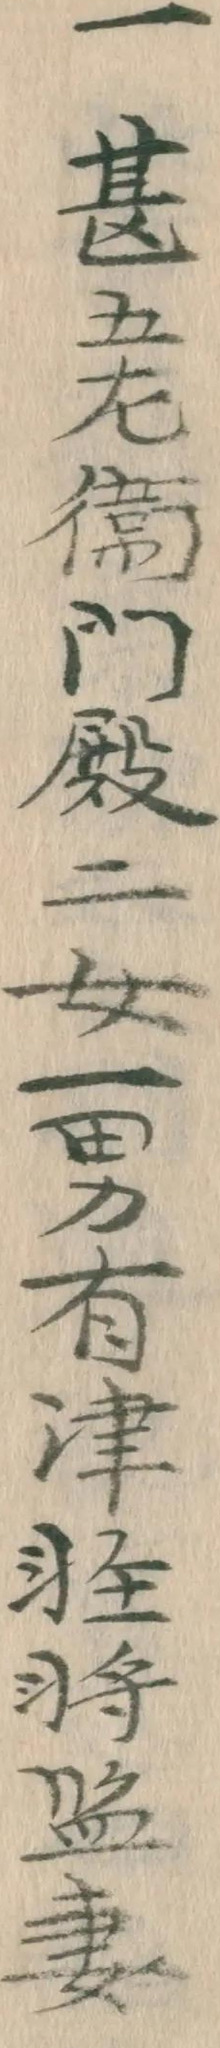一甚五左衞門殿二女一男有津軽将監妻
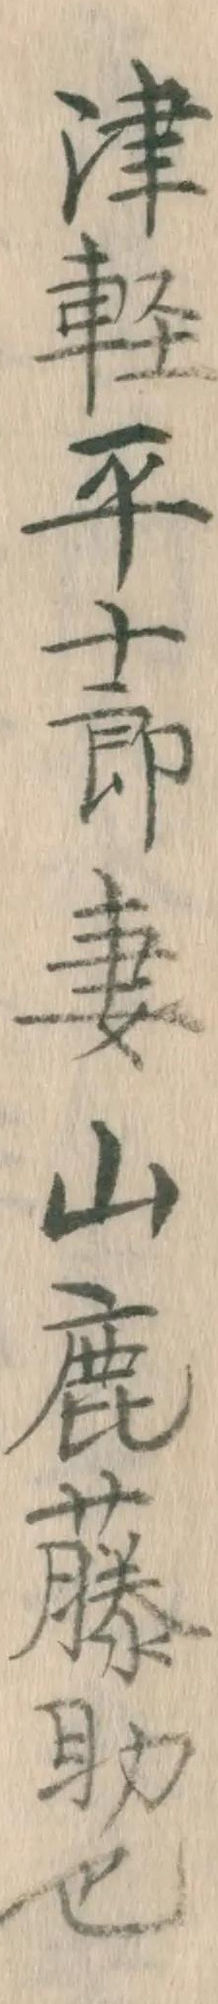津軽平十郎妻山鹿藤助也
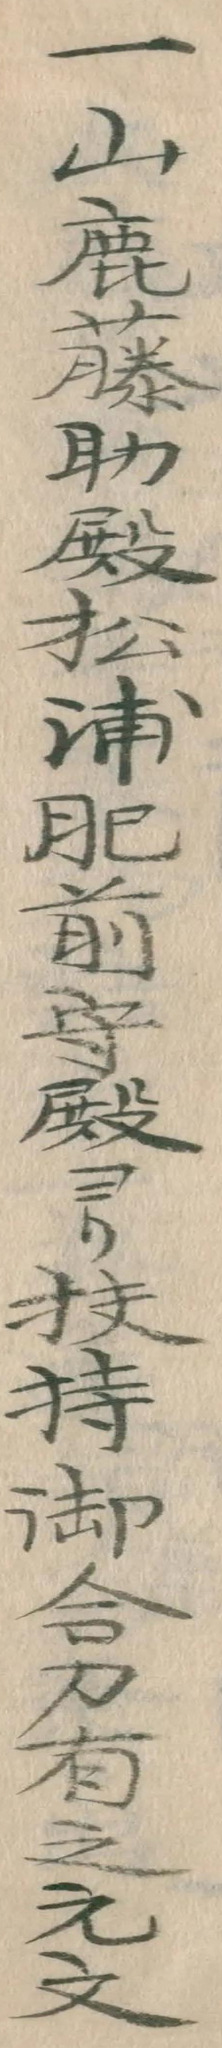一山鹿藤助殿松浦肥前守殿ヨリ扶持御合力有之元文
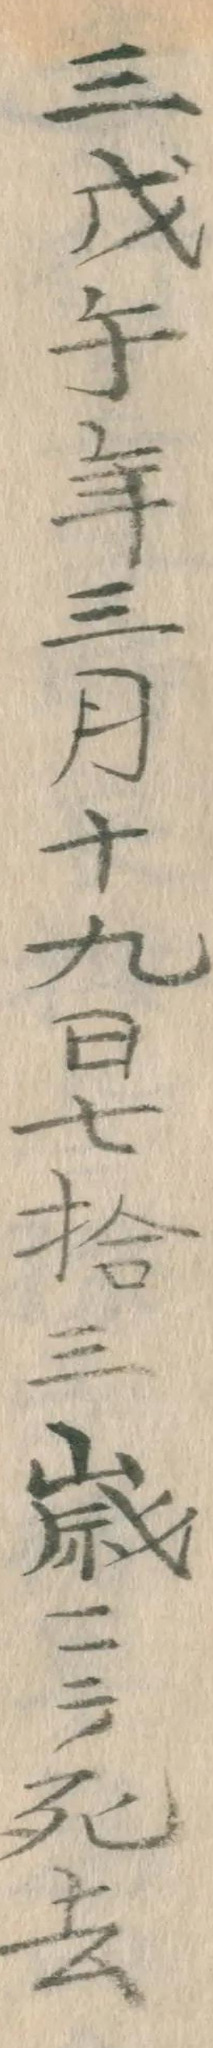三戊午年三月十九日七拾三歳ニテ死去
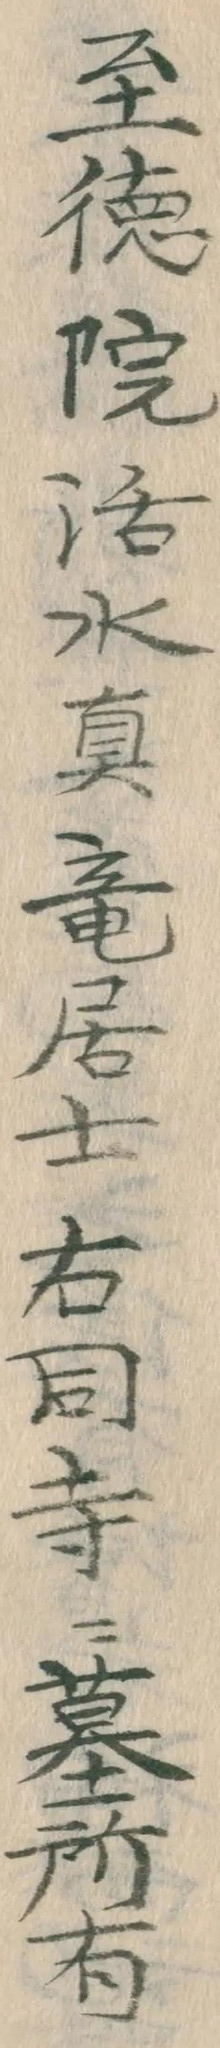至徳院活水真竜居士右同寺ニ墓所有
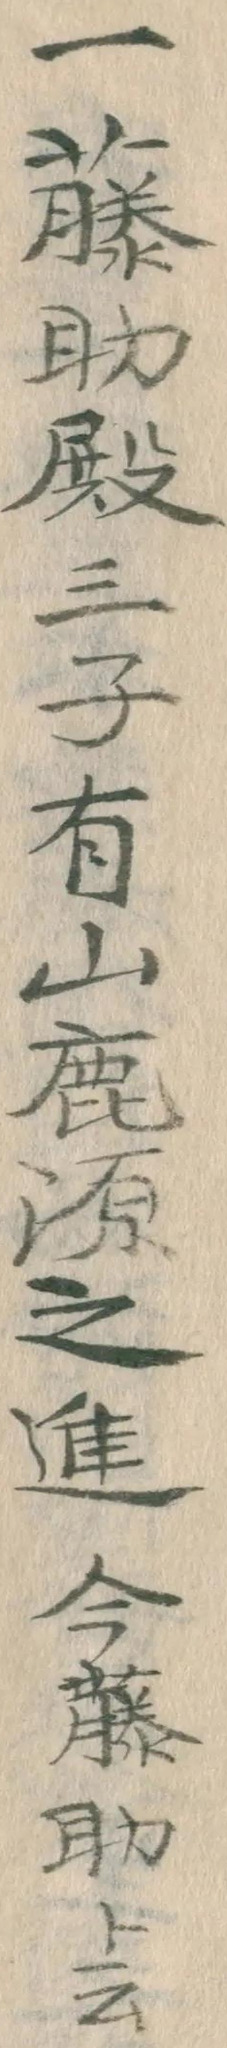一藤助殿三子有山鹿源之進今藤助ト云
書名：輪池叢書. 12
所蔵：国立国会図書館 National Diet Library, JAPAN
